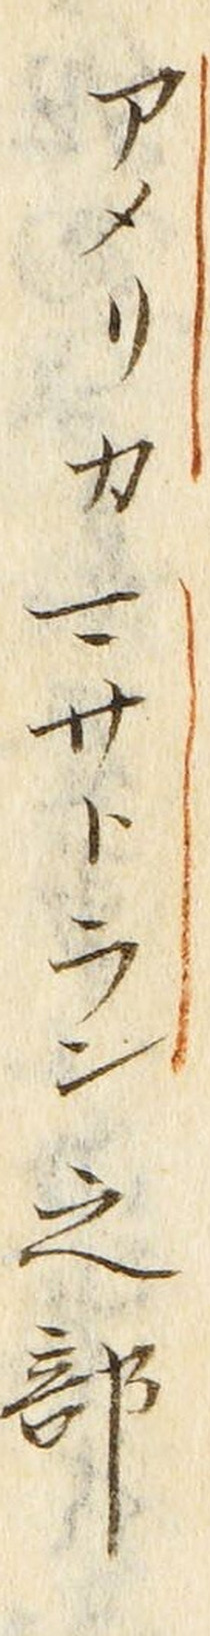アメリカ一サトラン之部
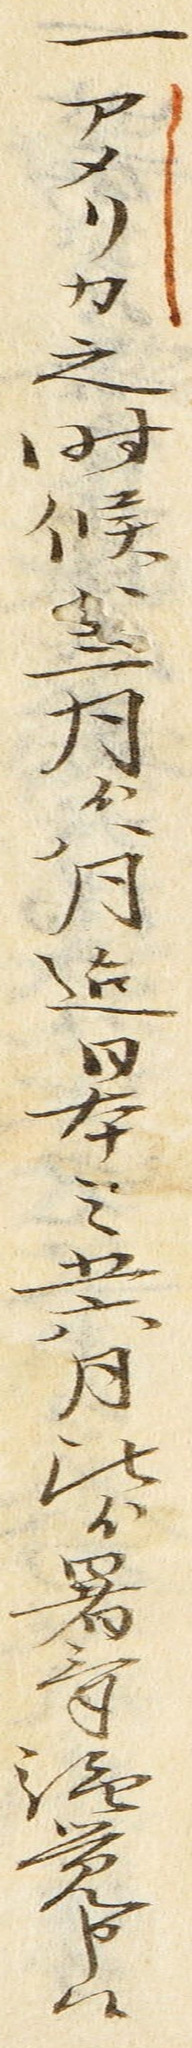一アメリカ之時候は三月ゟ八月迠日本之五六月頃ゟ暑気続覚申候
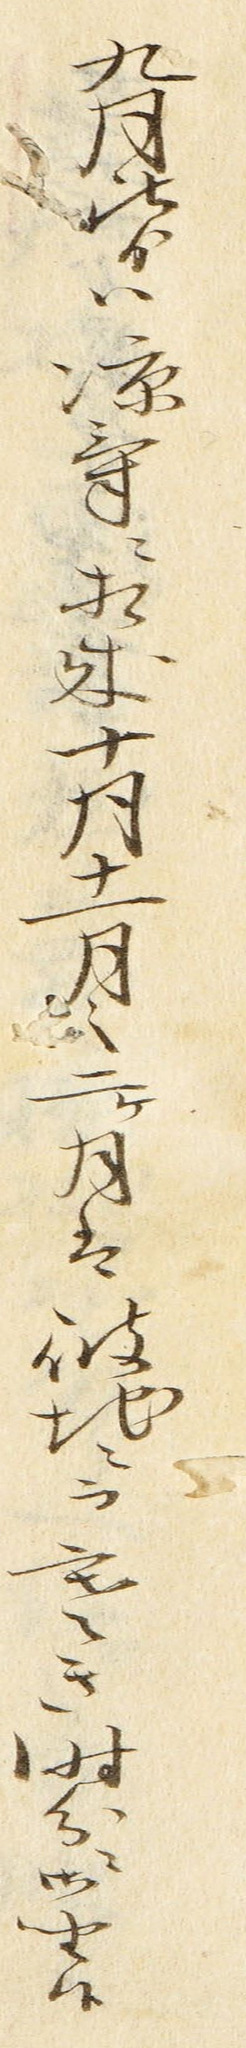九月頃ゟは涼気に相成十月十一月之二ケ月は彼地に而寒き時分に御座候
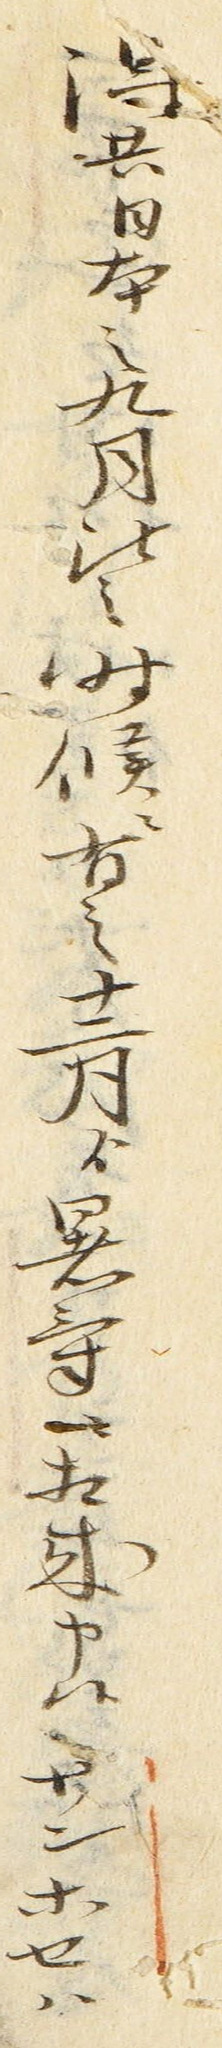得共日本之九月頃之時候に有之十二月ゟ暑気に相成申候サンホセは

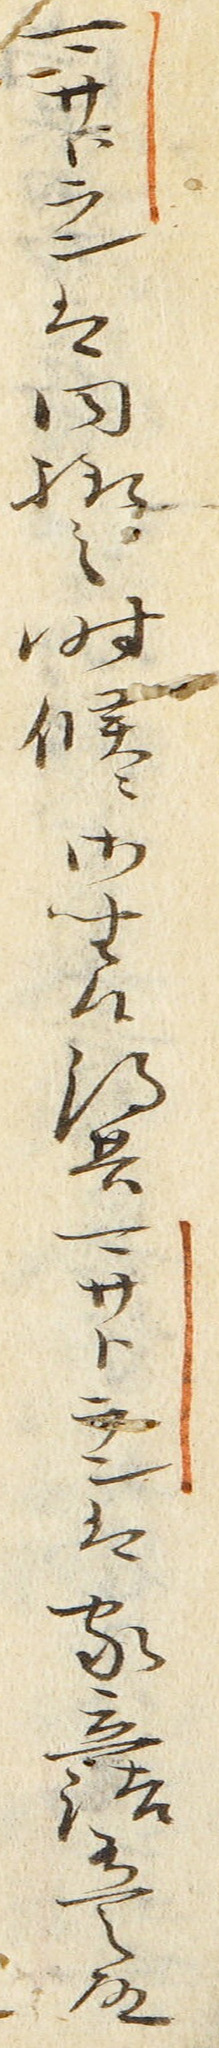一サトランは同様之時候に御座候得共一サトランは家立詰有可之故
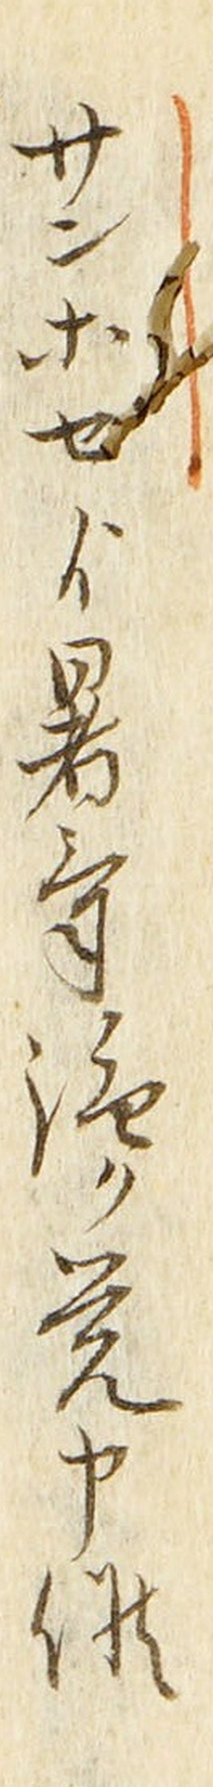サンホセゟ暑気絶ク覚申候
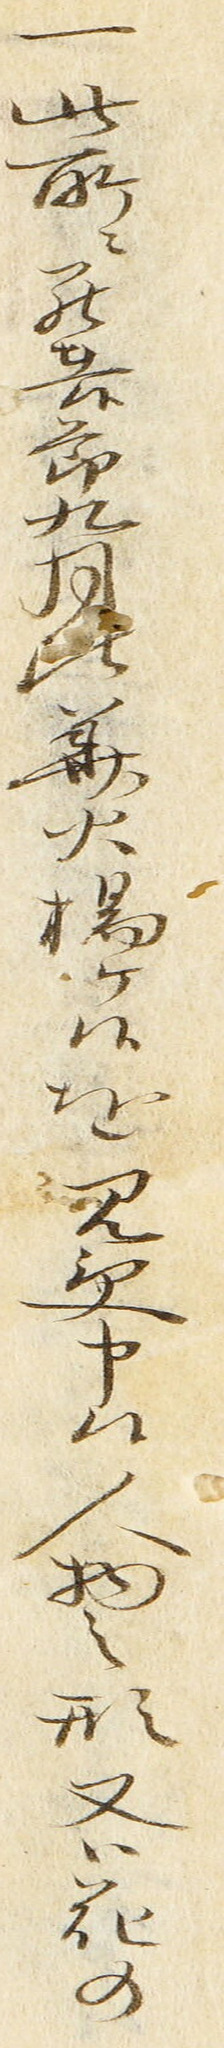一此所に罷在候節九月頃華火揚ケ候を見受申候人物之形又は花の
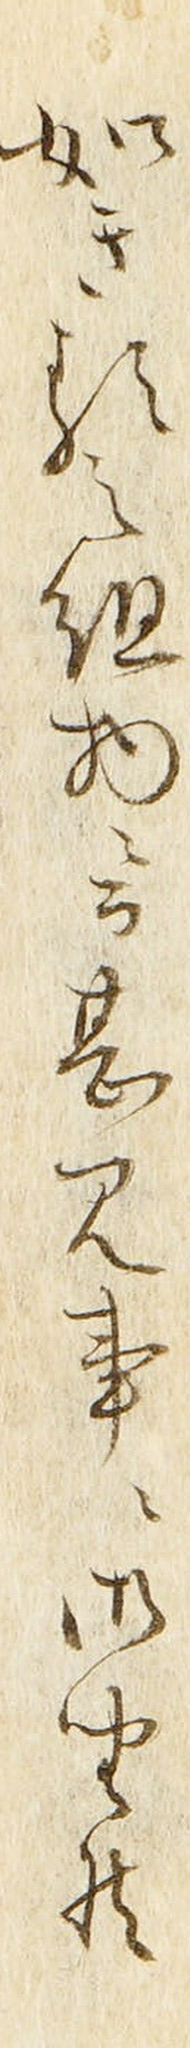如き類之組物に而甚見事に御座候
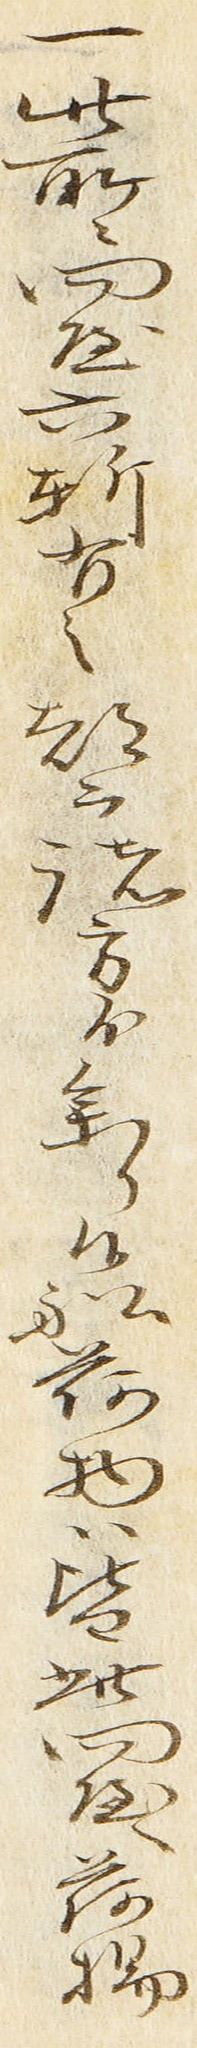一此所に四屋六軒有之却而諸方ゟ参り候船荷物は皆此四屋へ荷揚
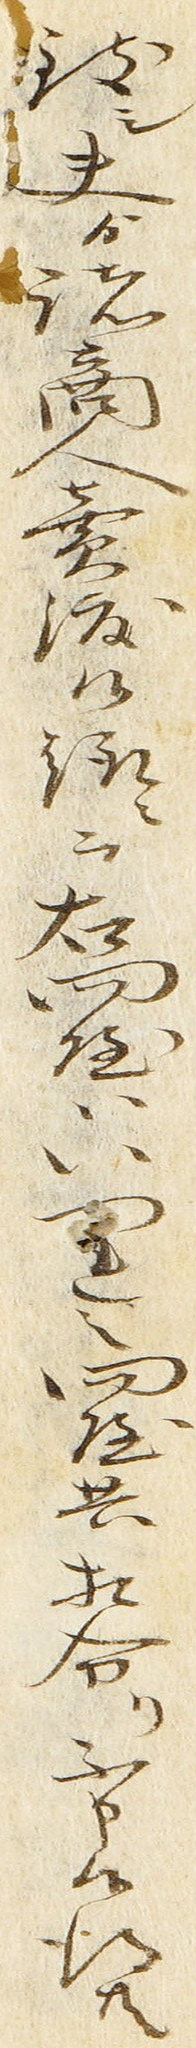致し夫ゟ諸商人売渡候趣に而右四屋はいつれ之四屋共相分り不申候得共
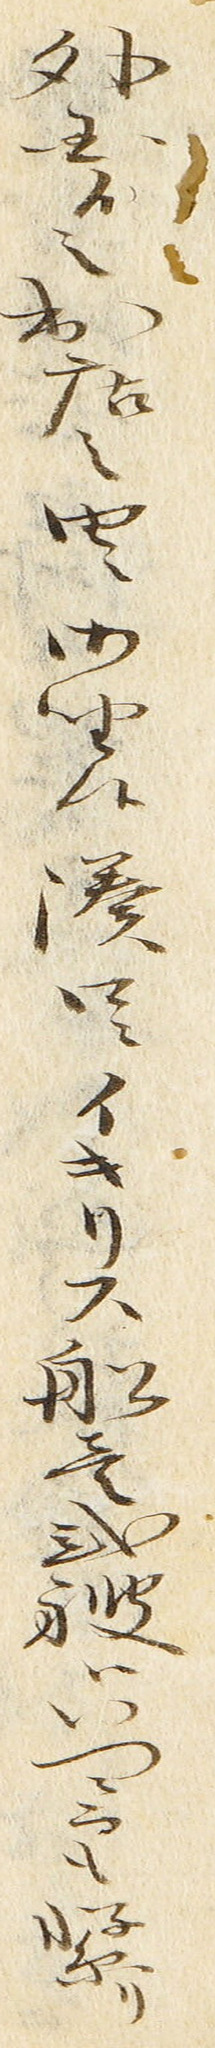外国ゟ之出店之由に御座候湊口にイキリス船壱弐艘はいつに而も繋り
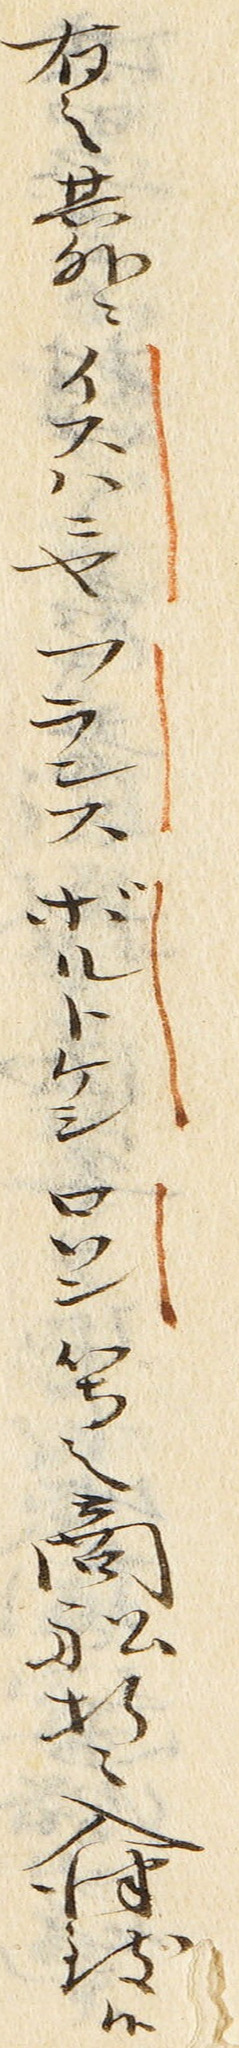有之其外にイスハニヤフランスボルトケシロソン等之商船折々入津致候
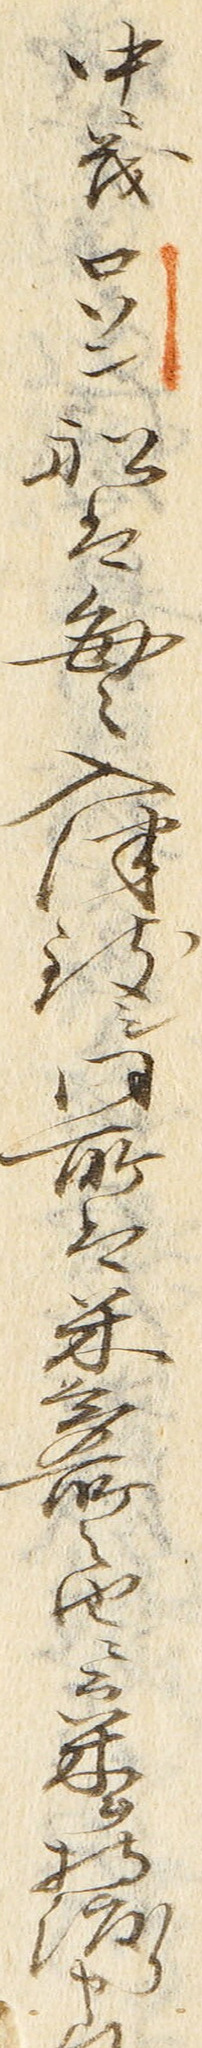中にもロソン船は毎々入津致し同所は米多所之由に而米ヲ持渡り申候
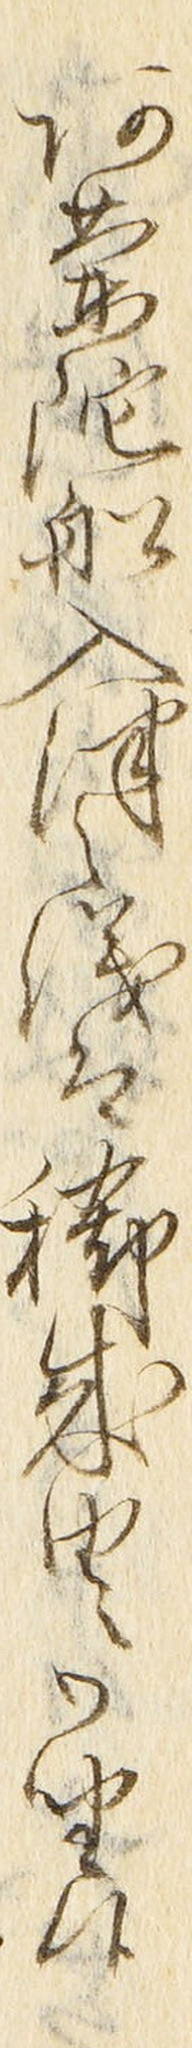阿蘭陀船入津之儀は？来由之御座候
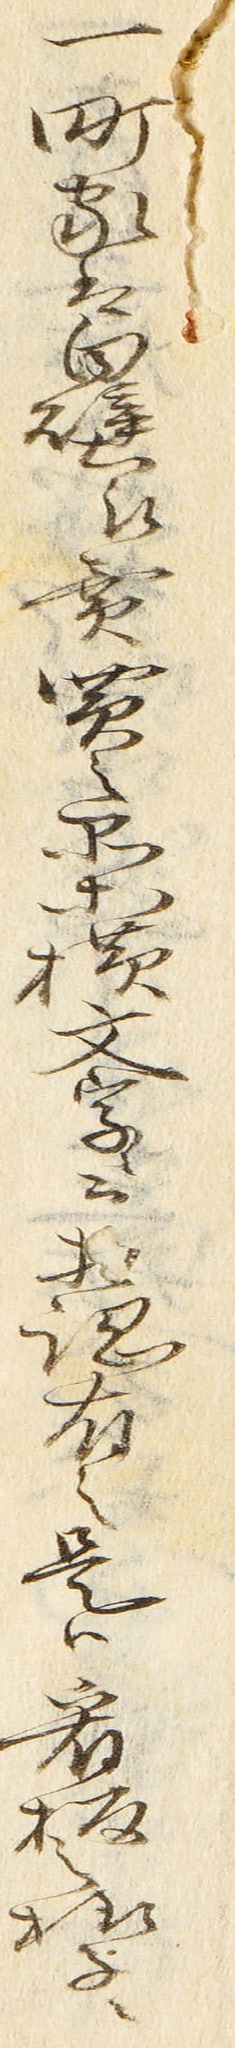一町家は白壁候売買之品等横文字に而相認有之是は看板之様子に
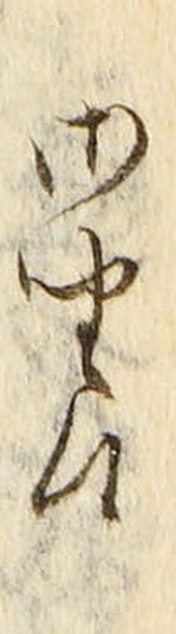御座候
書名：漂流人弥市之記
